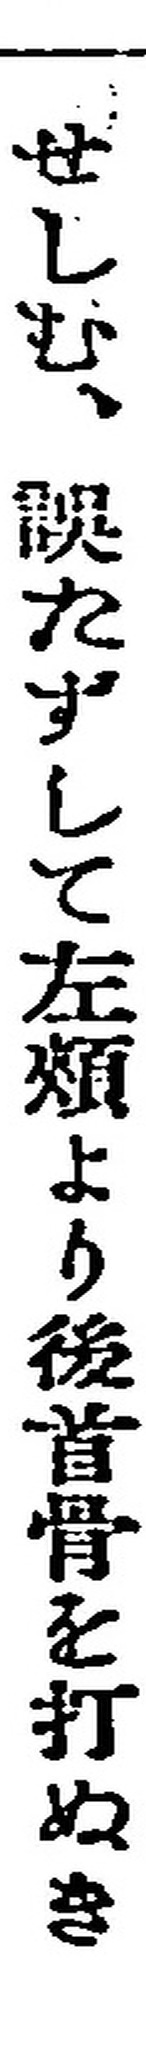せしむ、誤たずして左頬より後首骨を打ぬき
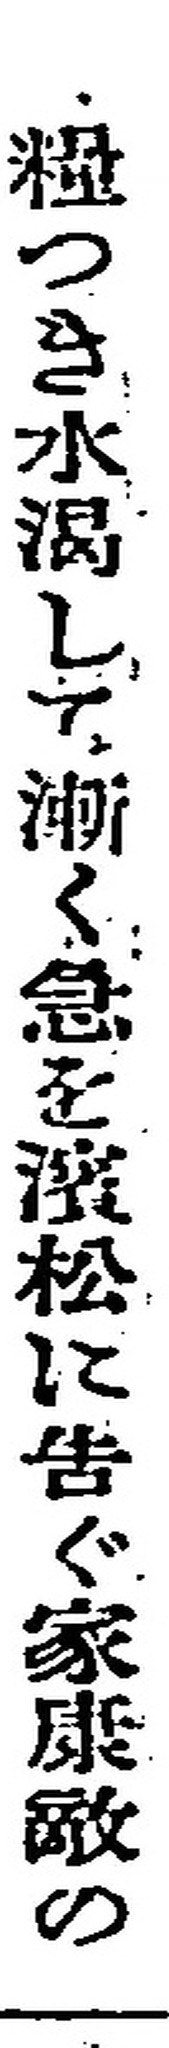糧つき水渇して漸く急を浜松に告ぐ家康敵の
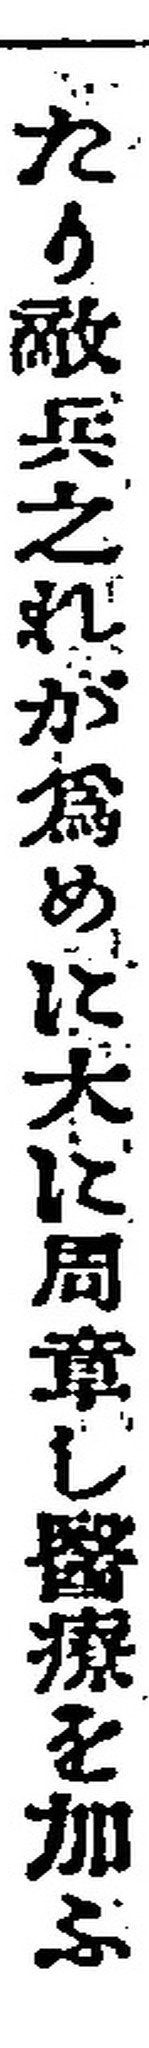たり敵兵之れが為めに大に周章し医療を加ふ
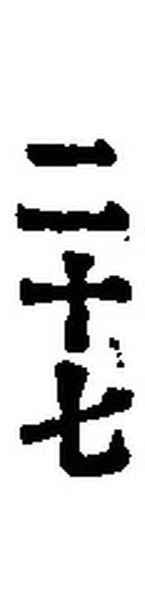二十七

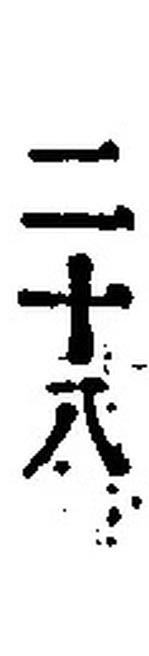二十八
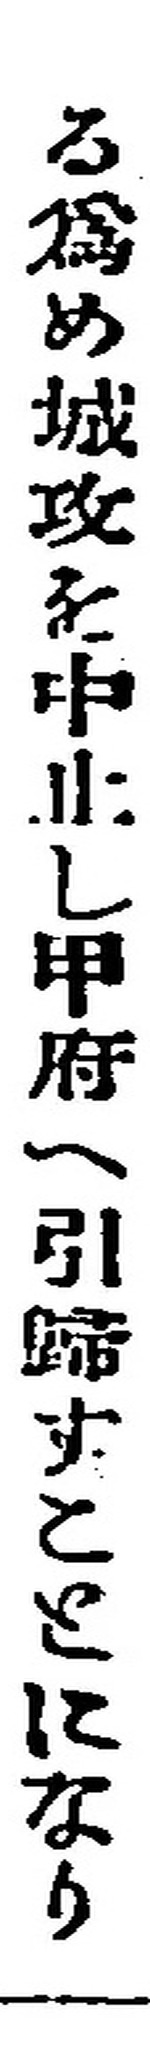る為め城攻を中止し甲府へ引帰すことになり
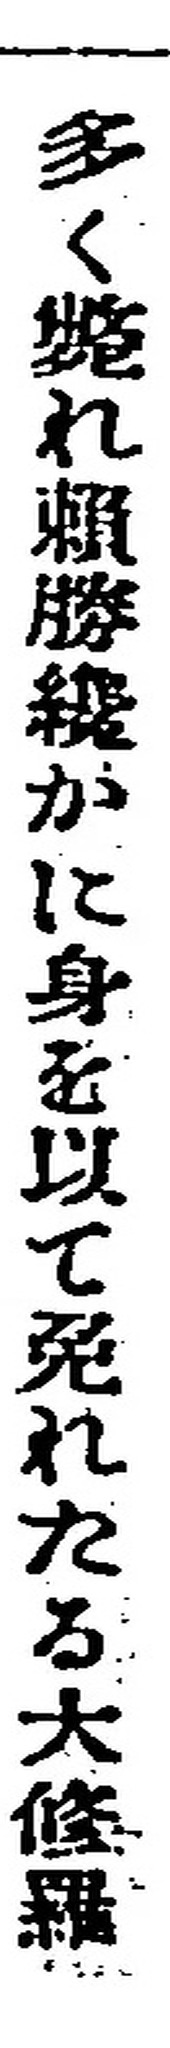多く斃れ頼勝纔かに身を以て免れたる大修羅
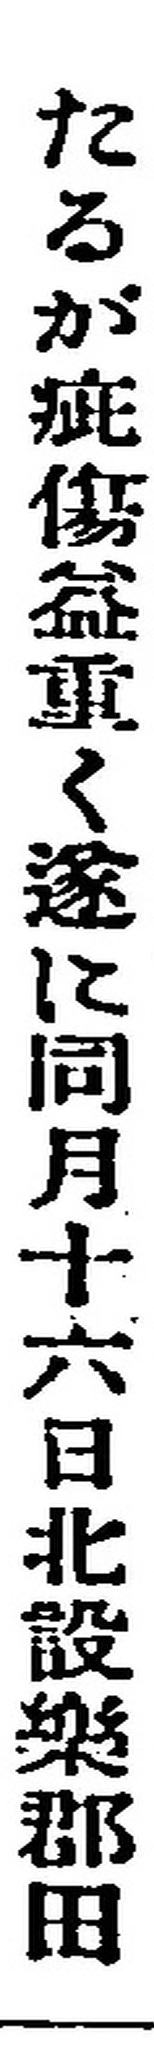たるが疵傷益重く遂に同月十六日北設楽郡田
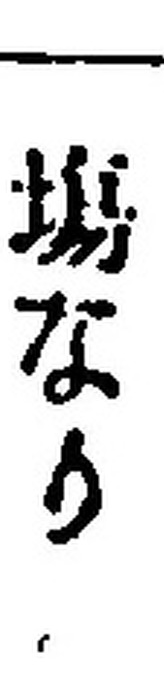場なり
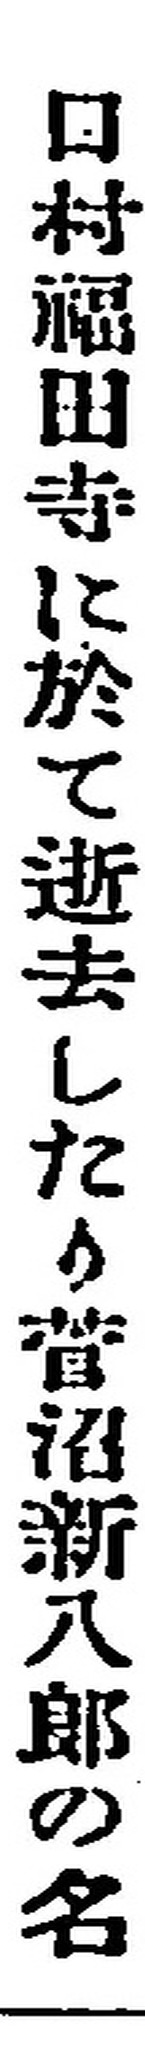口村福田寺に於て逝去したり菅沼新八郎の名
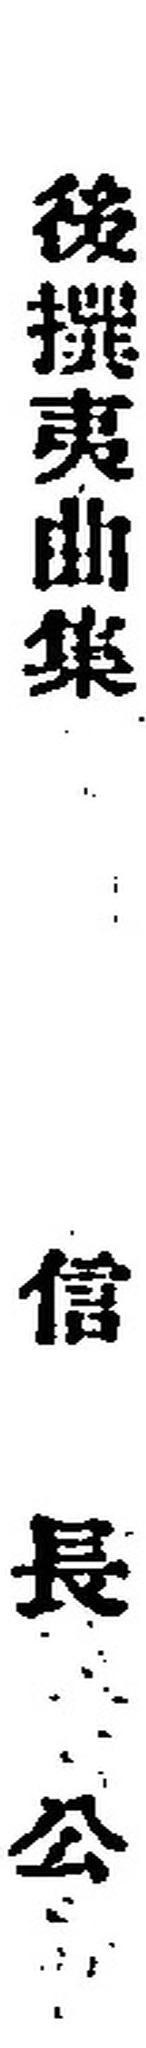後撰夷曲集信長公
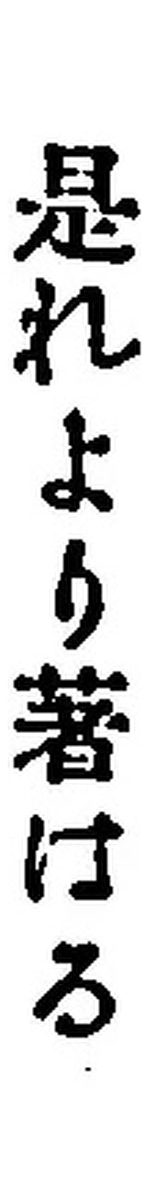是れより著はる
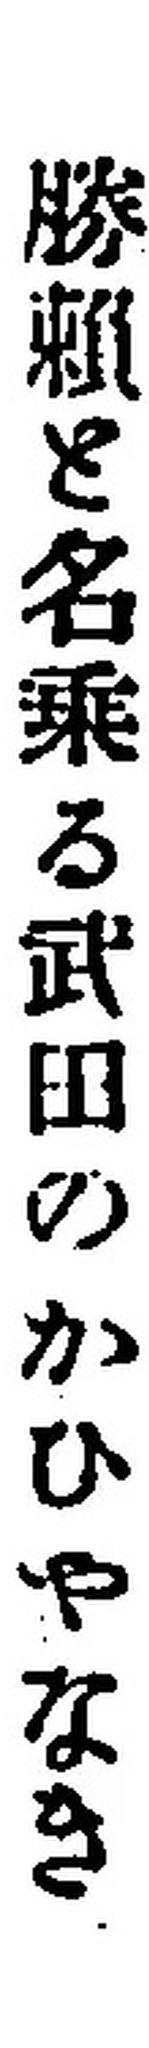勝頼と名乗る武田のかひやなき
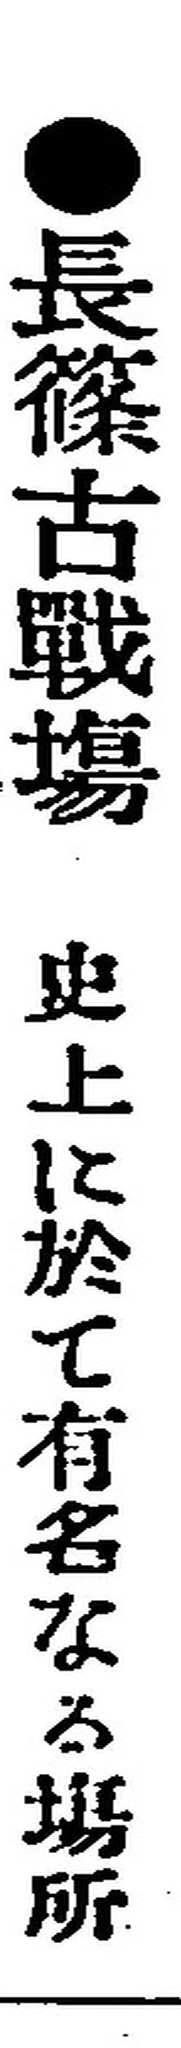●長篠古戦場史上に於て有名なる場所
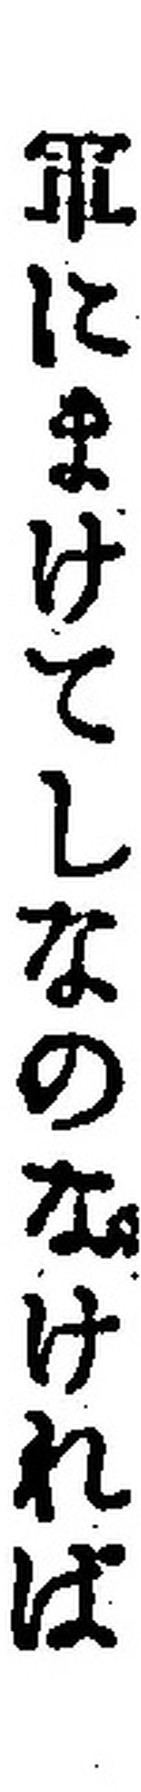軍にまけてしなのなければ
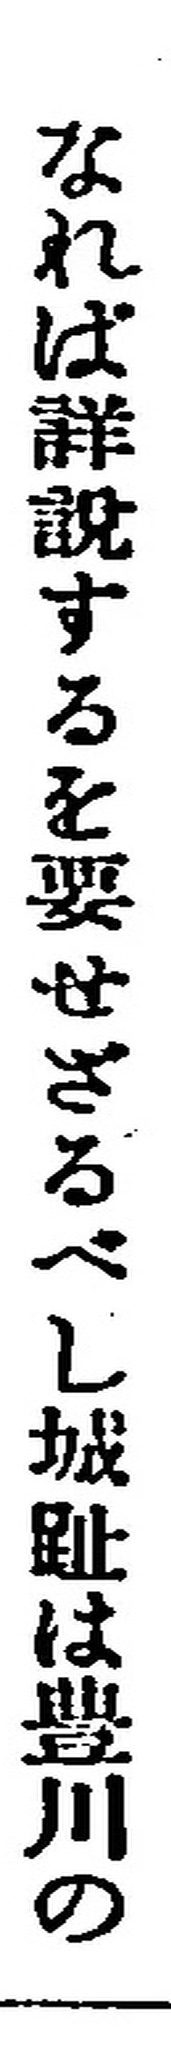なれば詳説するを要せざるべし城趾は豊川の
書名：東参名勝案内
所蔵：国立国会図書館 National Diet Library, JAPAN
